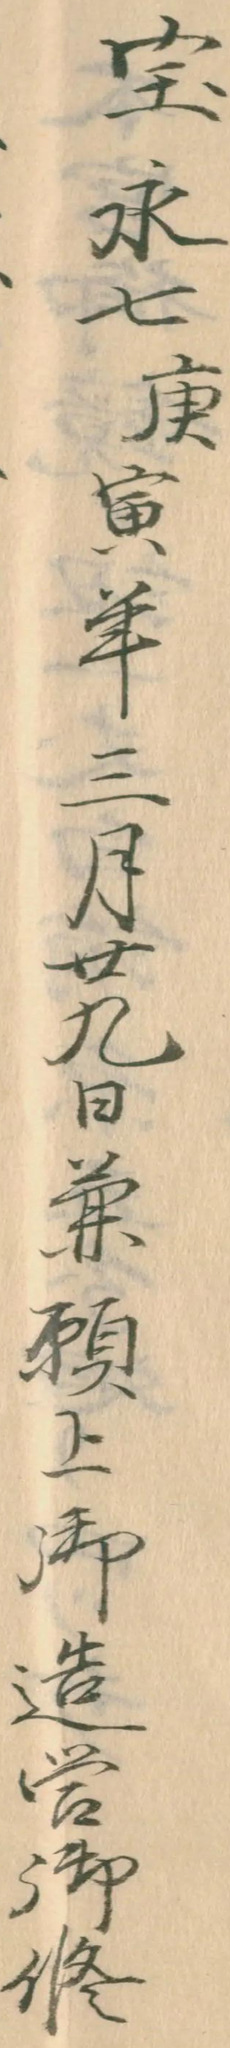宝永七庚寅年三月廿九日兼願上御造営御修
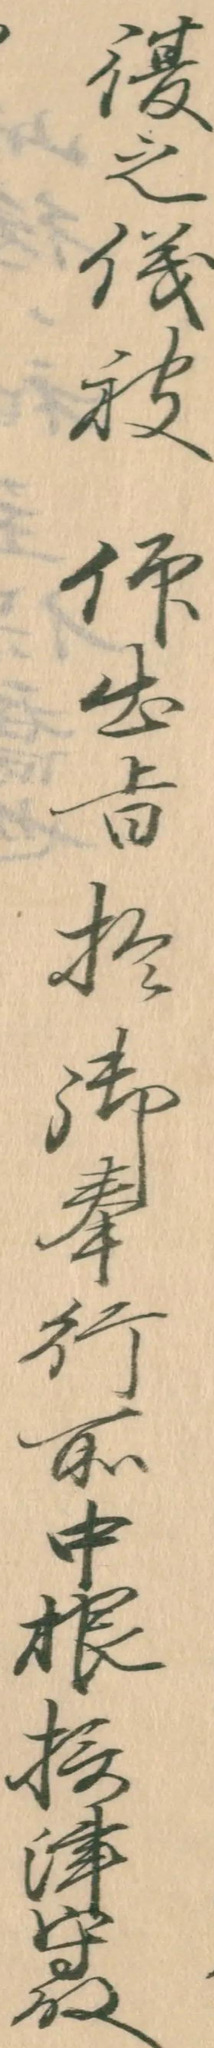復之儀被仰出旨於御奉行所中根摂津守殿
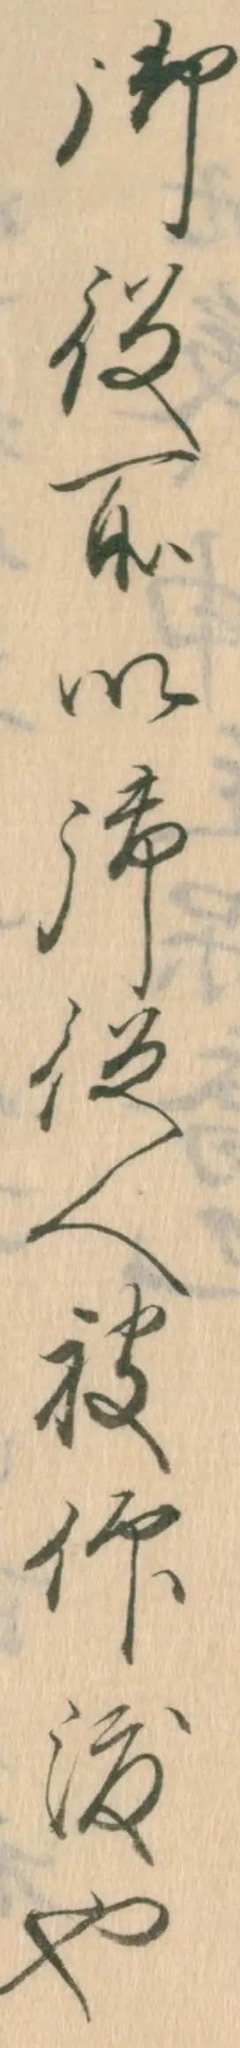御役所以御役人被仰渡也
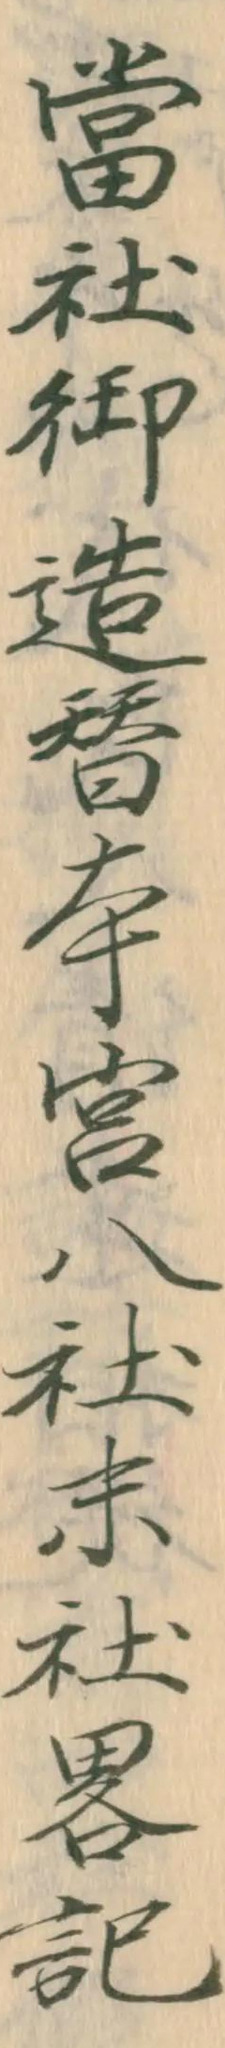当社御造替本宮八社末社略記
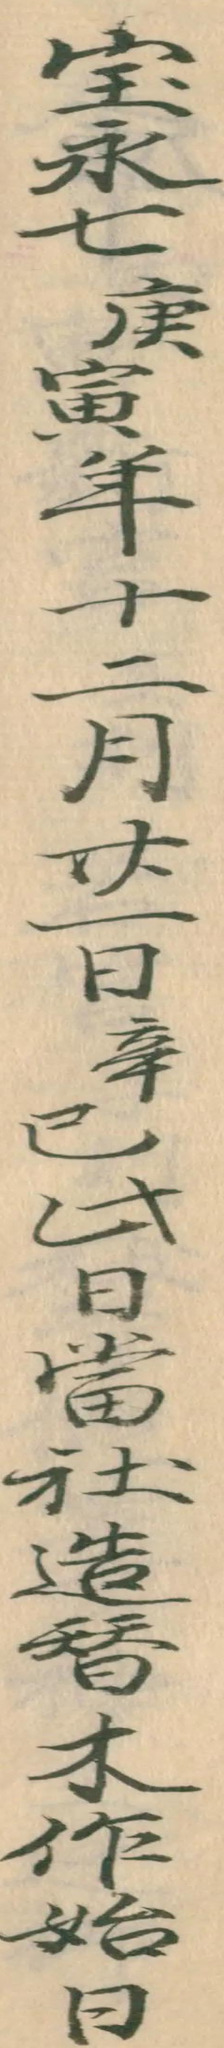宝永七庚寅年十二月廿一日辛巳此日当社造替木作始日
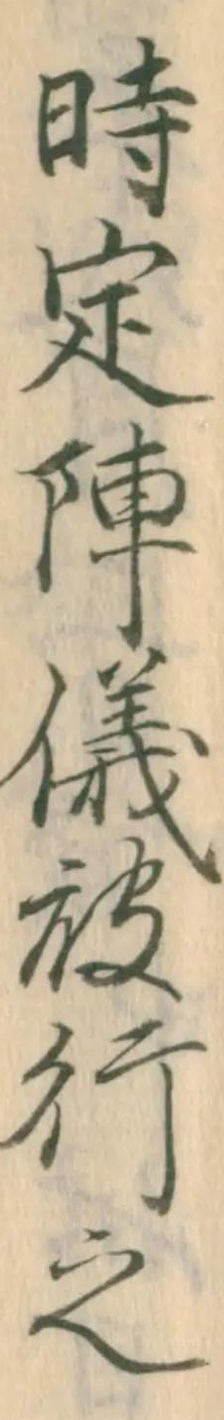時定陣儀被行之
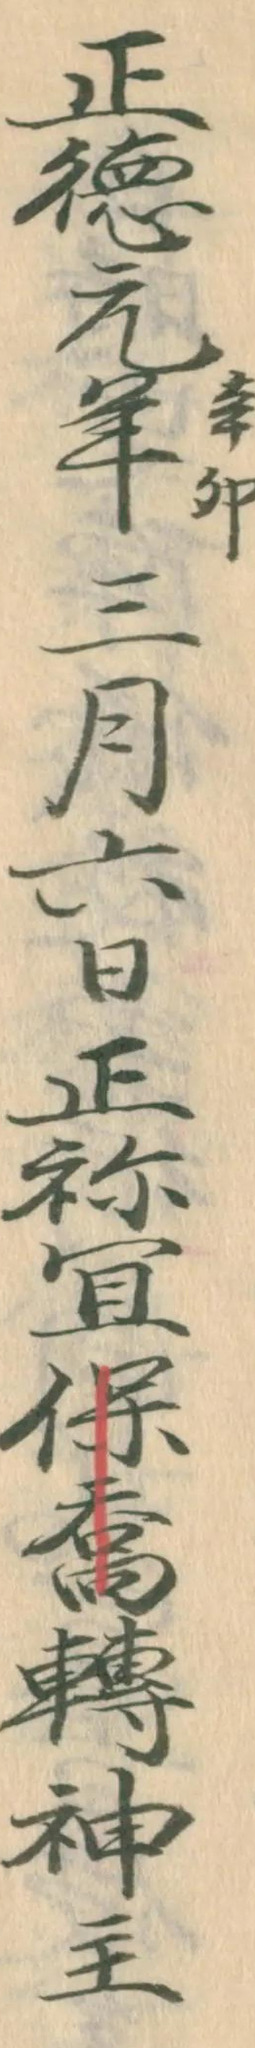正徳元年三月六日正祢宜保喬転神主
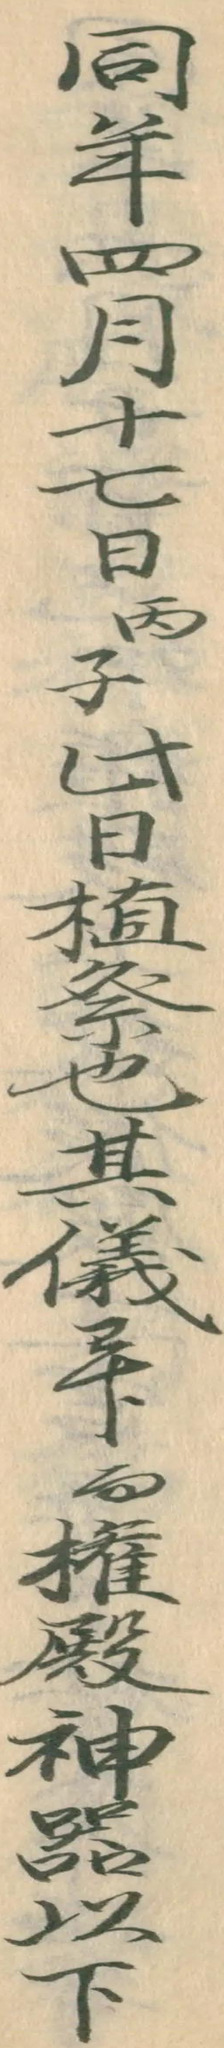同年四月十七日丙子此日植祭也其儀畢而権殿神器以下

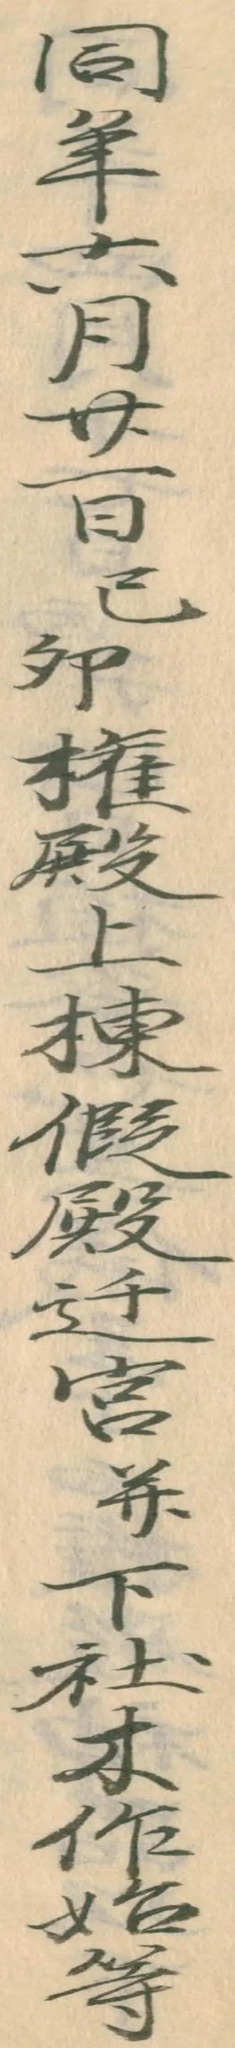同年六月廿一日己卯権殿上棟假殿迁宮并下社本作始等

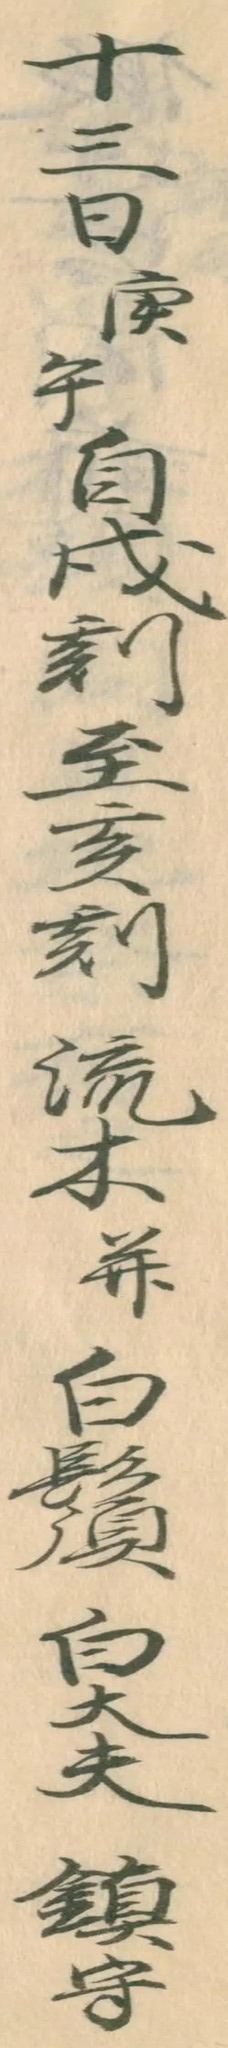十三日庚午自戌刻至亥刻流木并白鬚白大夫鎮守
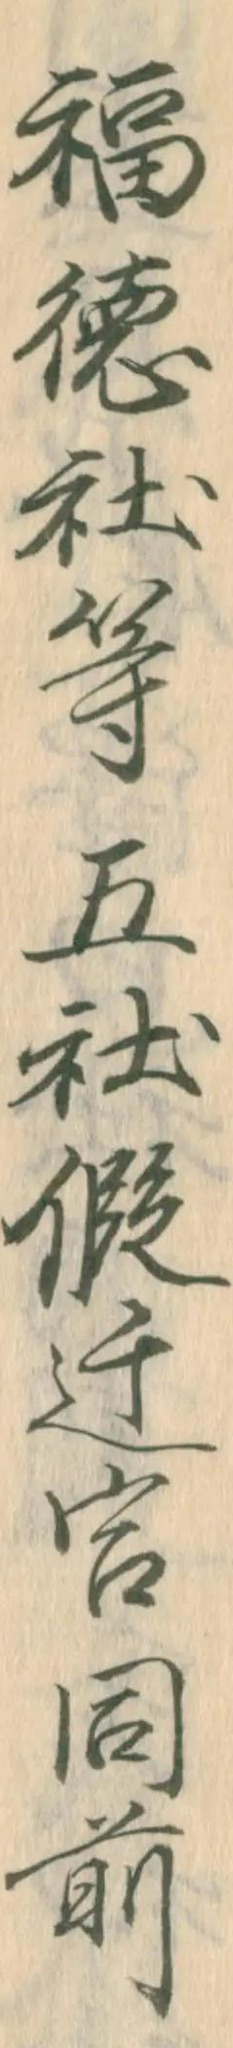福徳社等五社仮迁宮同前
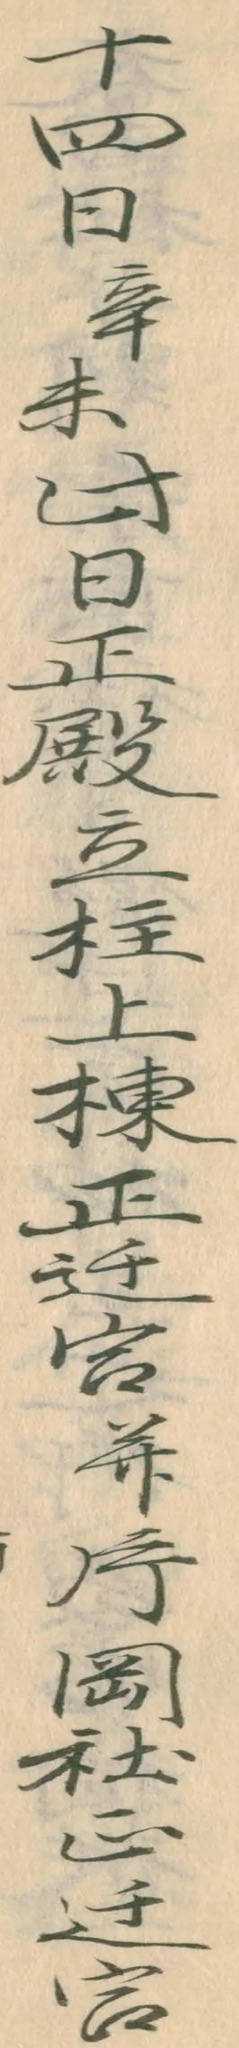十四日辛未此日正殿立柱上棟正迁宮并片岡社正迁宮
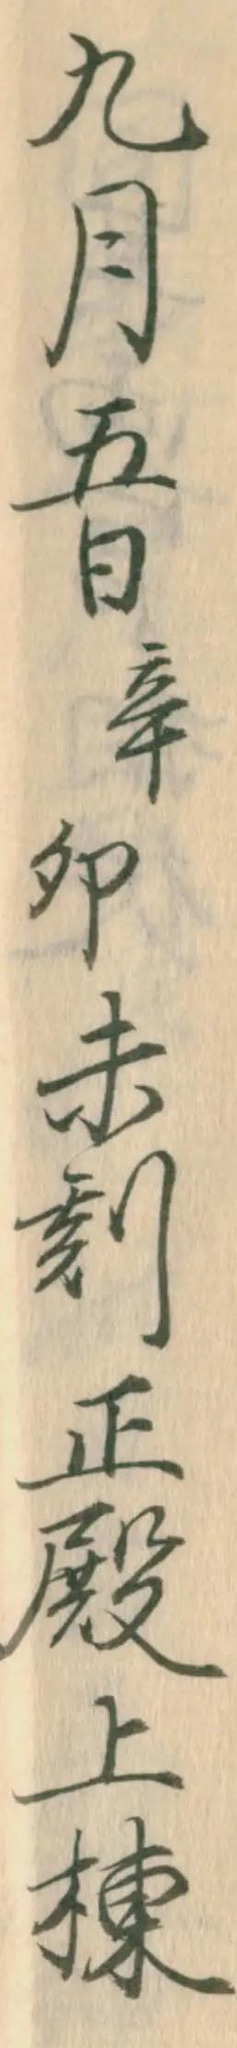九月五日辛卯未刻正殿上棟
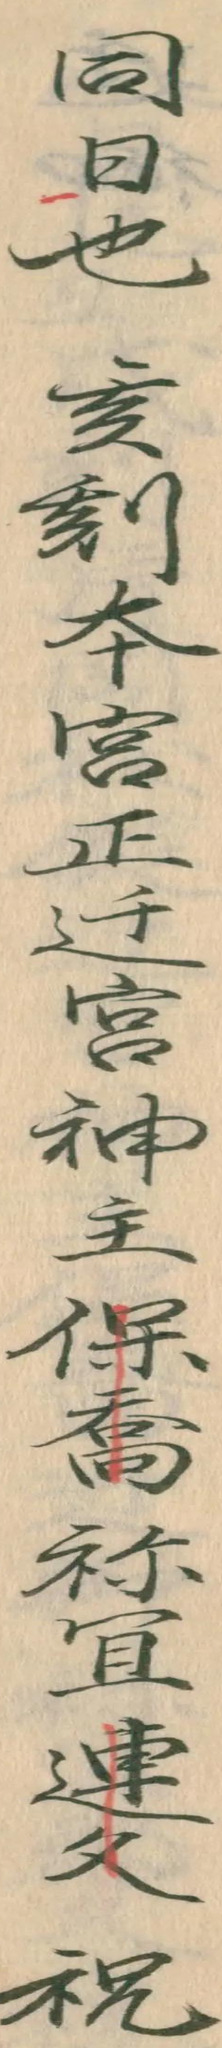同日也亥刻本宮正迁宮神主保喬祢宜連久祝
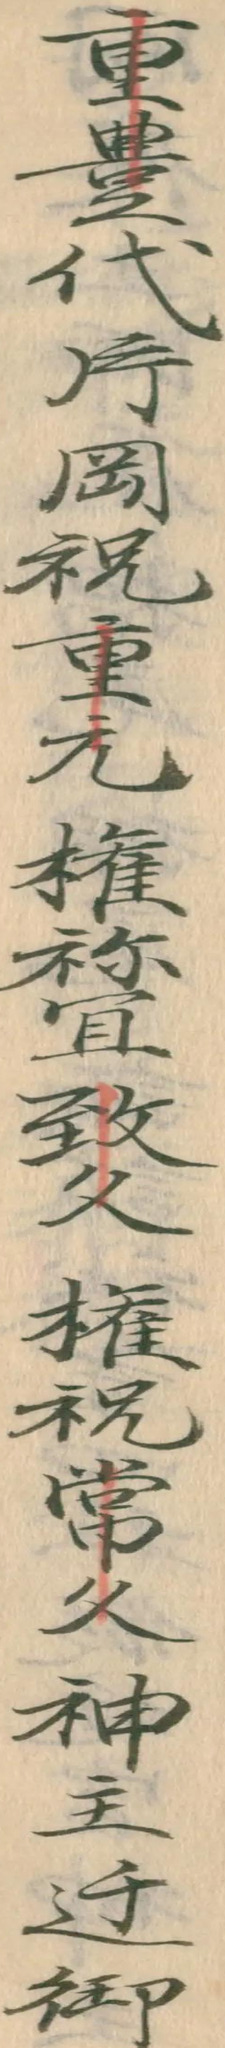重豊代片岡祝重元権祢宜致久権祝常久神主迁御
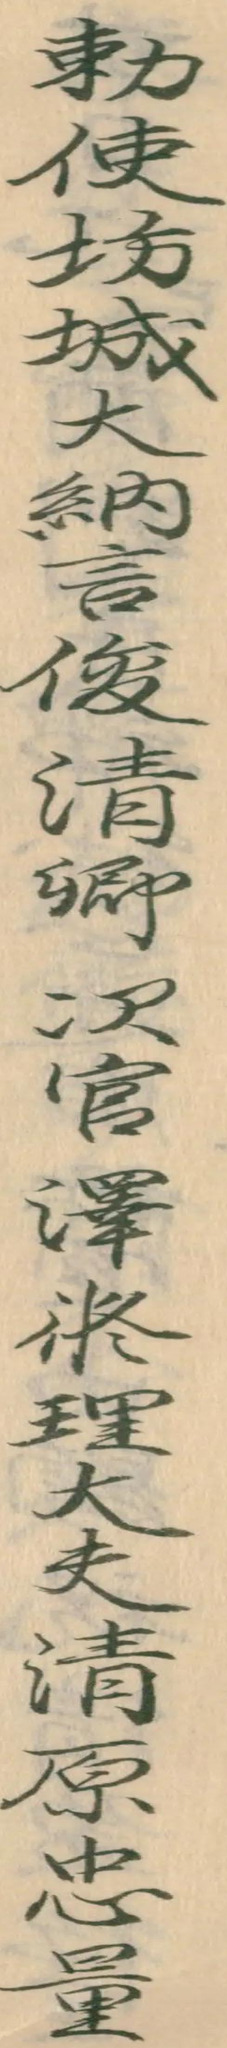勅使坊城大納言俊清卿次官澤修理大夫清原忠量
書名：賀茂社記録. 第15冊
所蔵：国立国会図書館 National Diet Library, JAPAN
